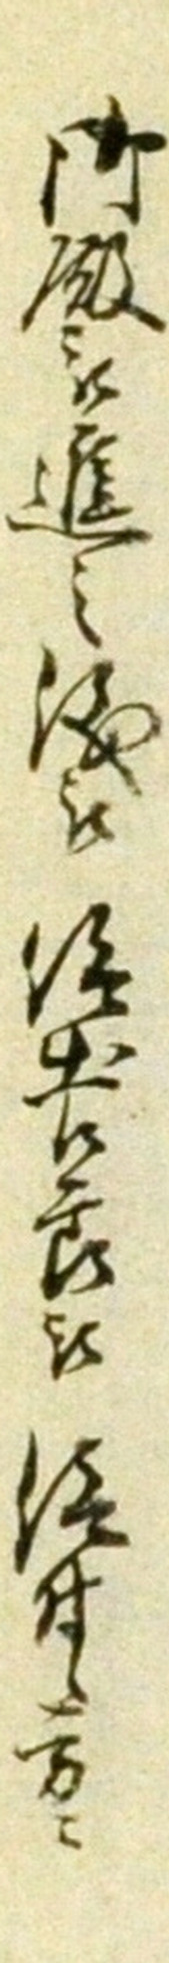御殿被進之儀被仰出候節被仰付候方ニ
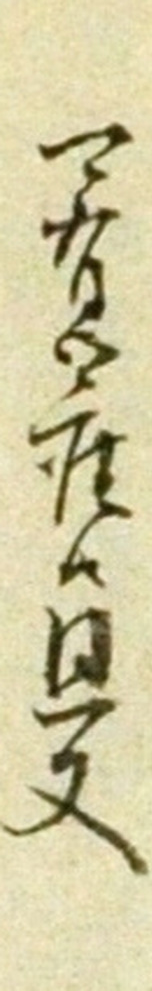可有御座候且又
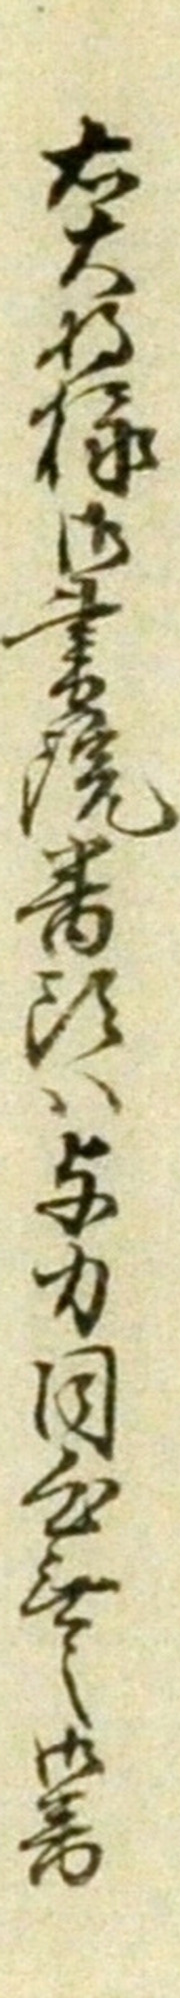右大将様御書院番頭ハ与力同心無之御番
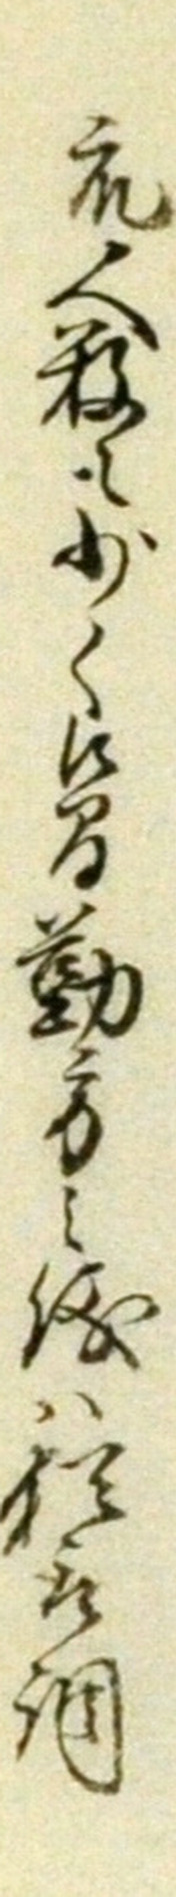衆人数も少く候間勤方之義ハ猶取調
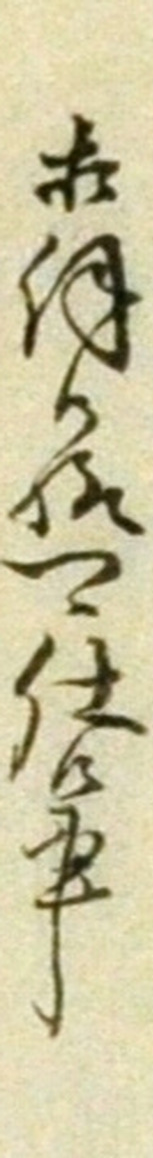相伺候様可仕候事
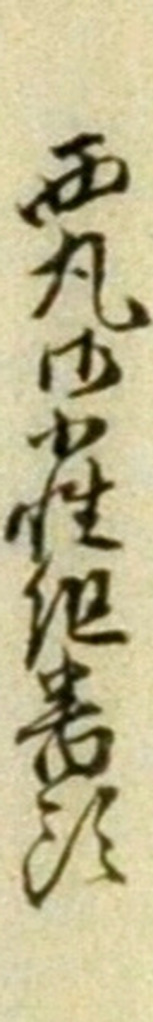西丸御小姓組番頭
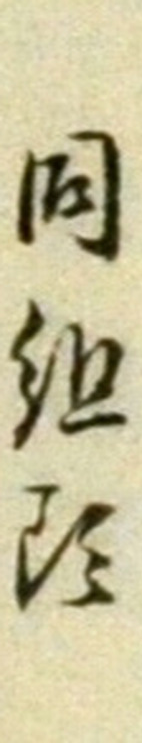同組頭
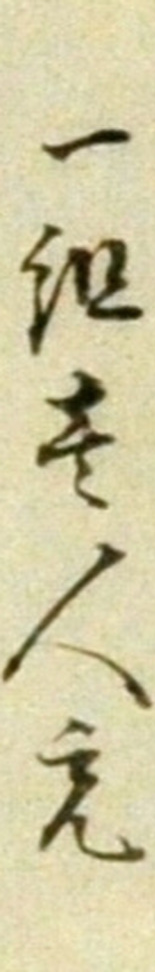一組壱人充
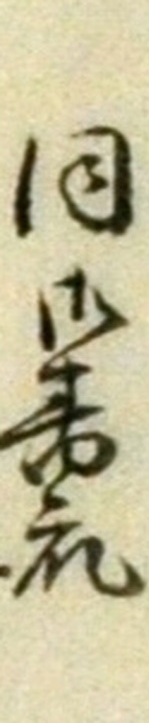同御番衆
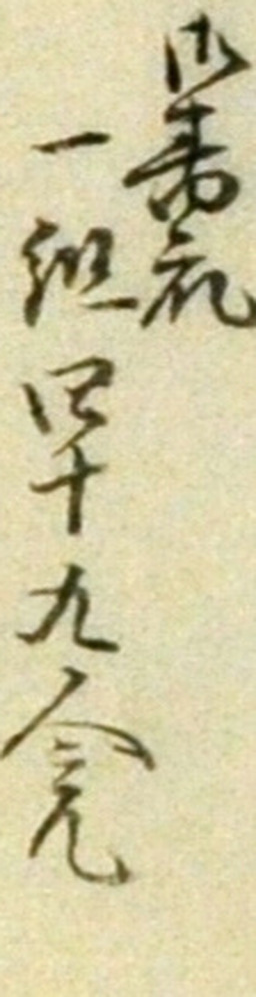一組四十九人充
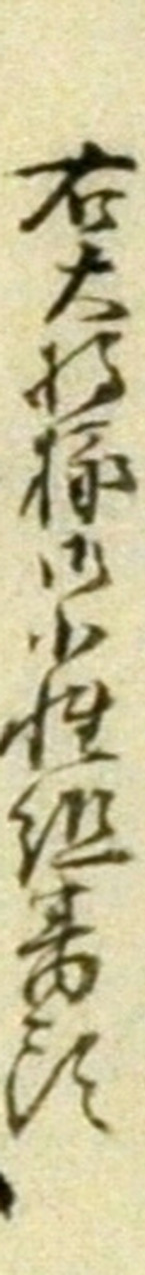右大将様御小姓組番頭
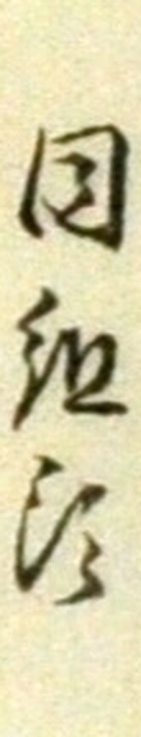同組頭
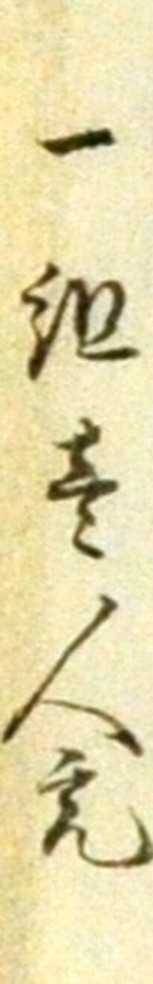一組壱人充

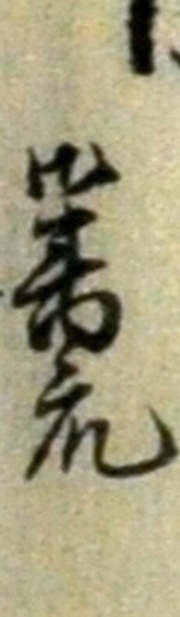御番衆
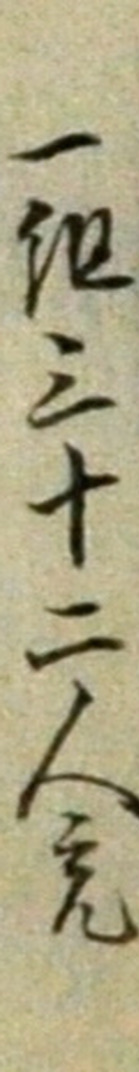一組三十二人充
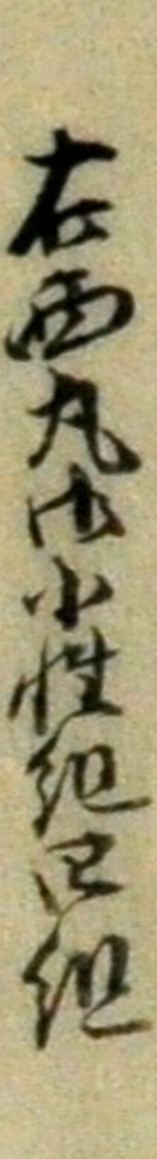在西丸御小姓組四組
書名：若年寄御役中御調書付
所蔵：伊那市立高遠町図書館・合同会社AMANE
